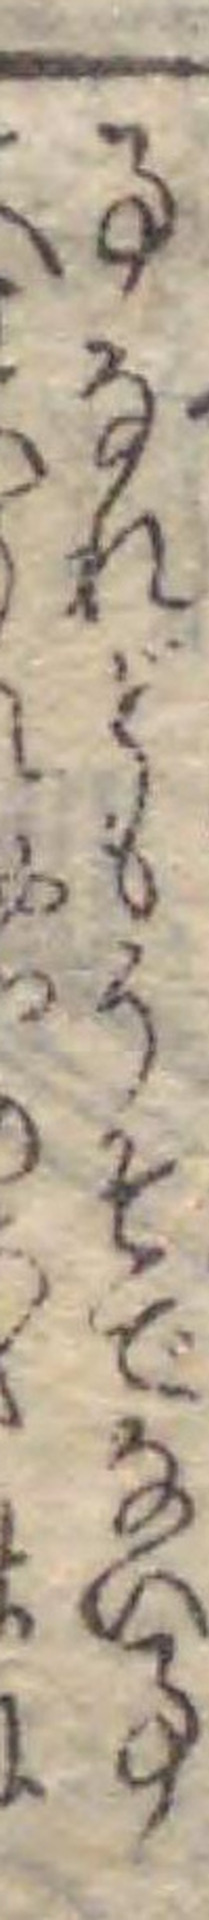事なれどもうそでない事
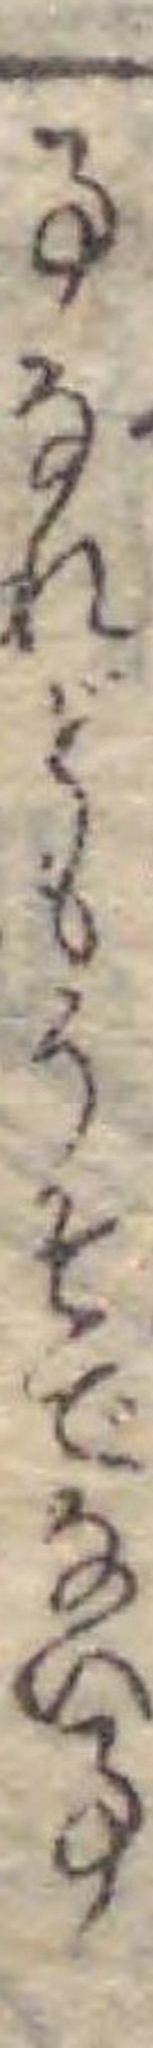事なれどもうそでない事
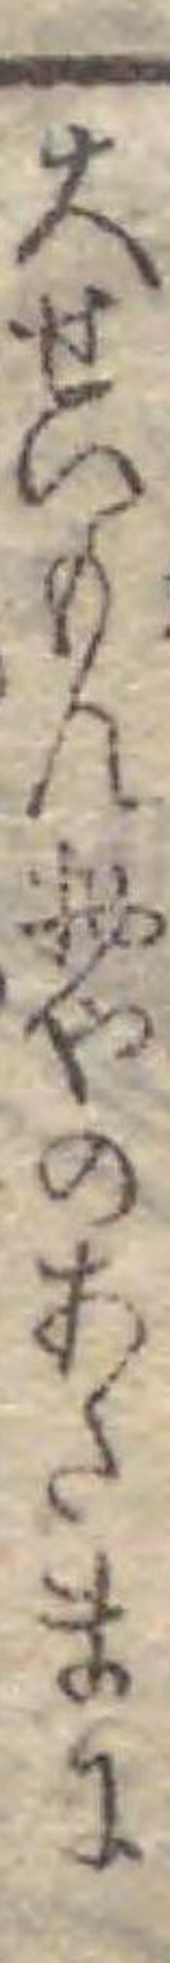大せいもんおやのあたまに
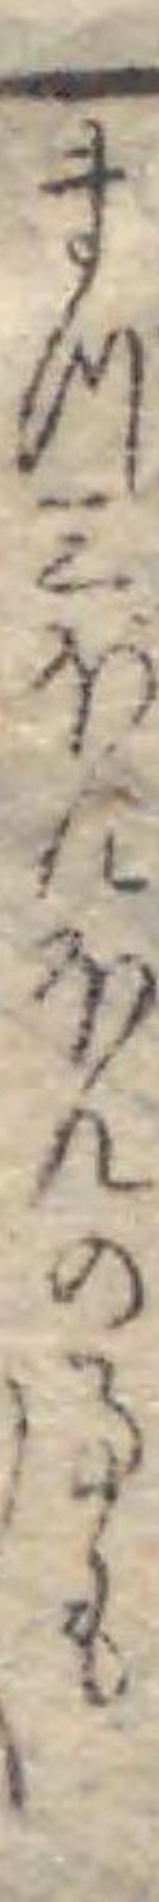まつみほんほんの事も
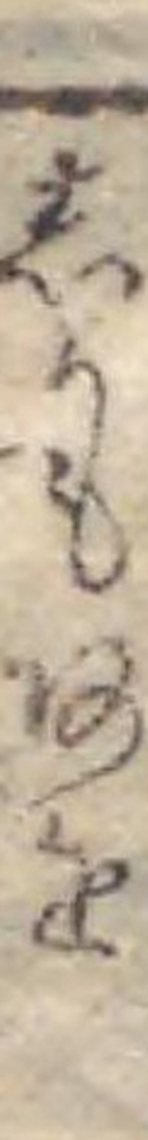しかもあを
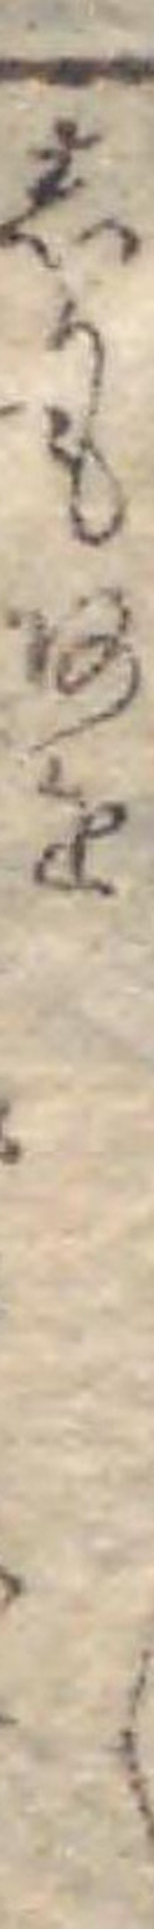しかもあを
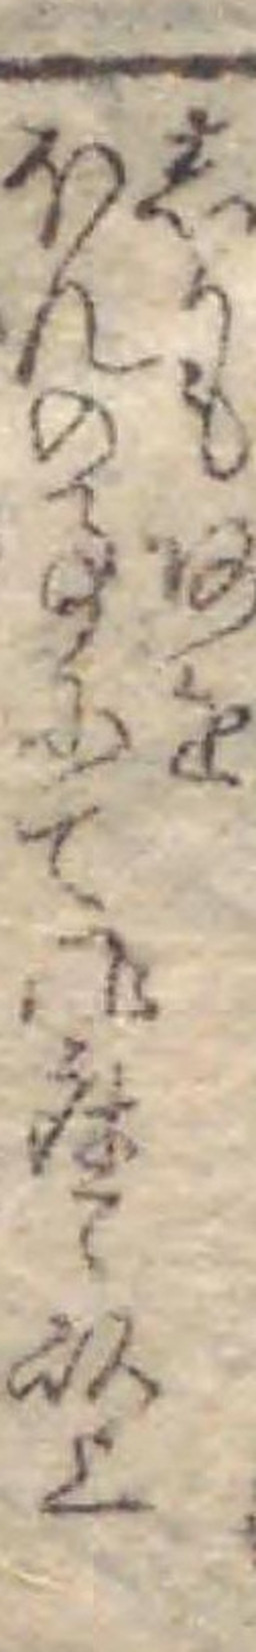ほんの事にて御座候以上
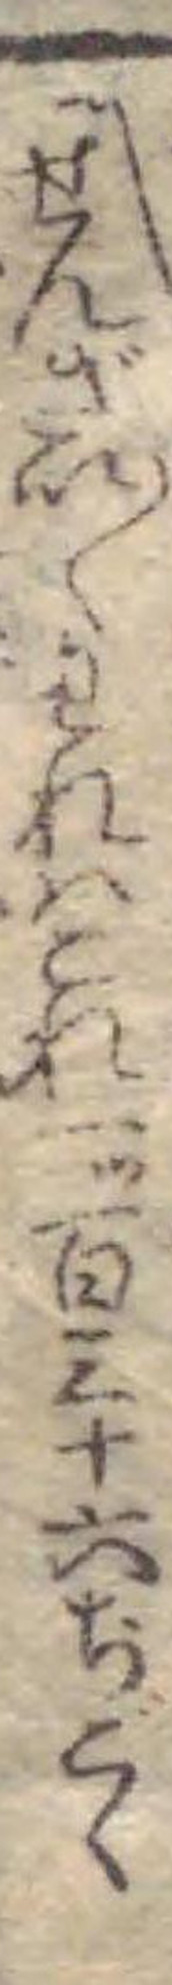〽せんざい〳〵されはこれ一ッ百三十六ぢごく
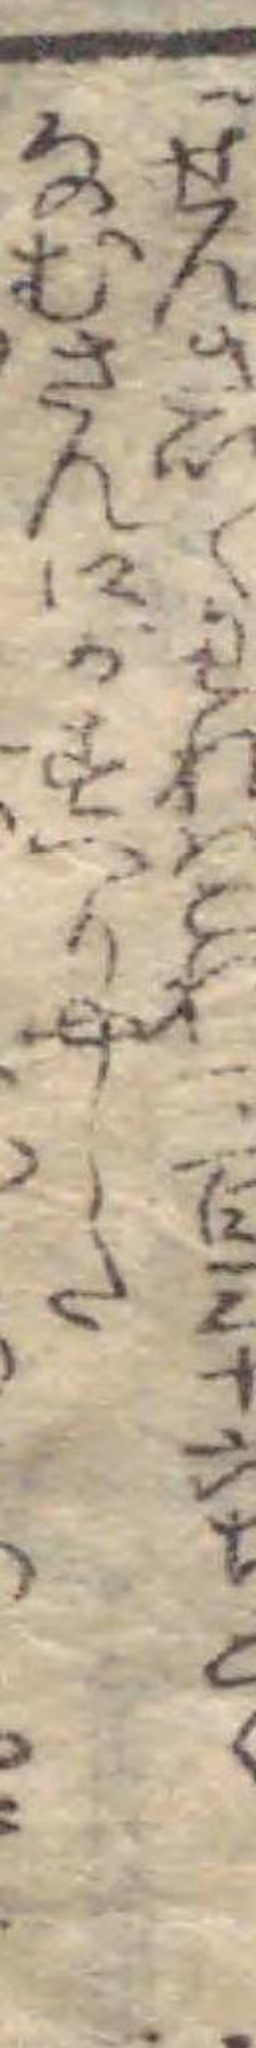なむさんにがすへりやした
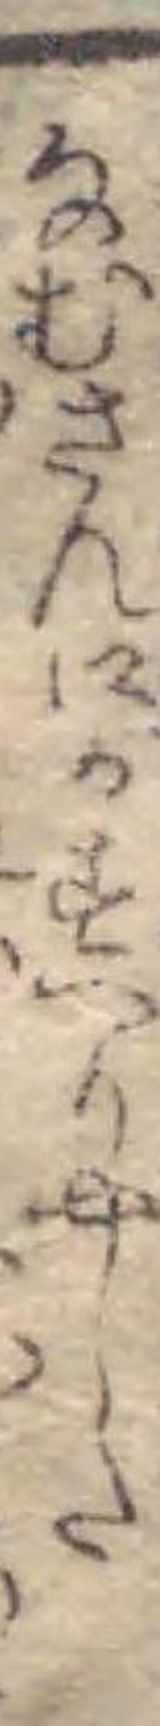なむさんにがすへりやした
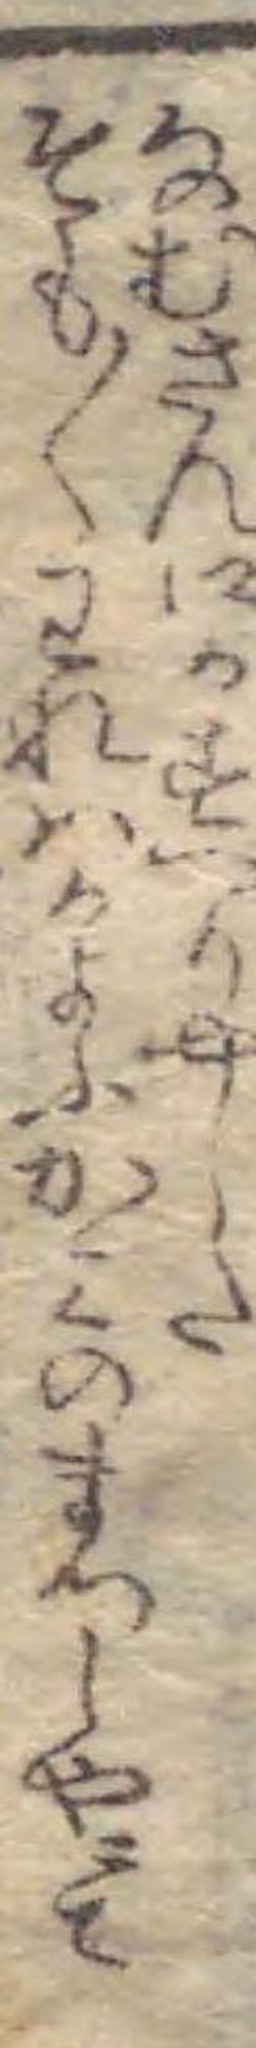そも〳〵われはかよふかみのまつしやにて
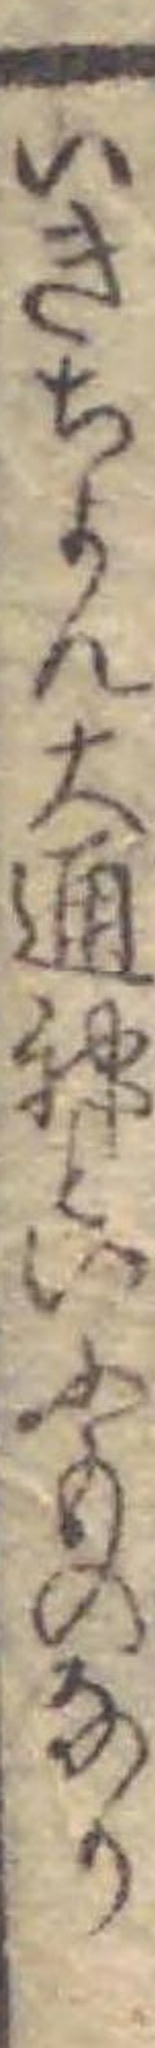いきちよん大通神といふものなり
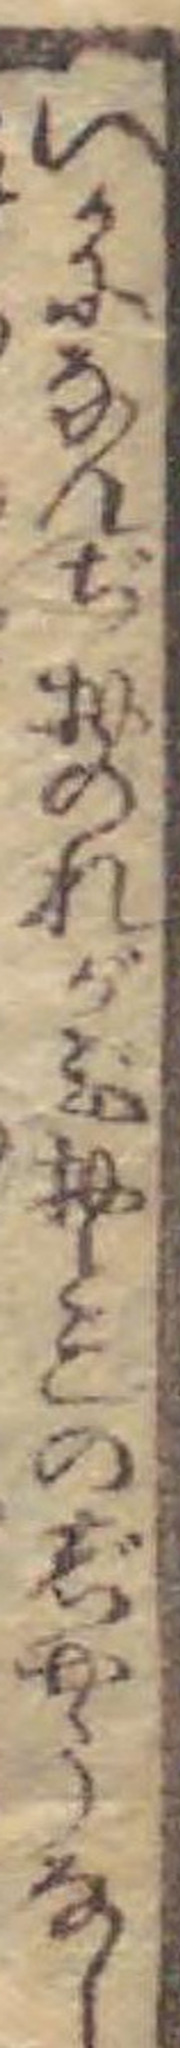いかになんぢおのれがぶおとこのじやうなし
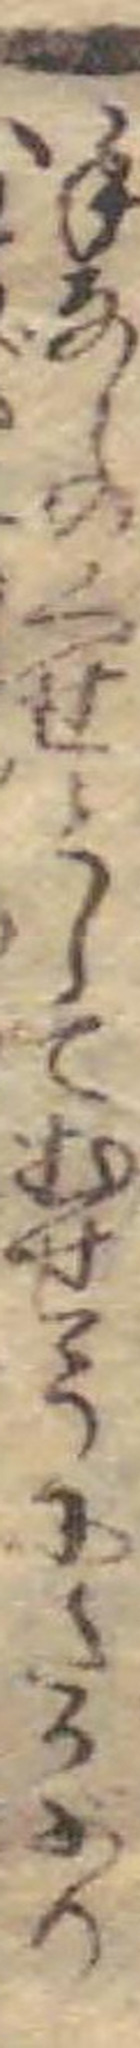手なしのくせとしてむせうにたかぶり
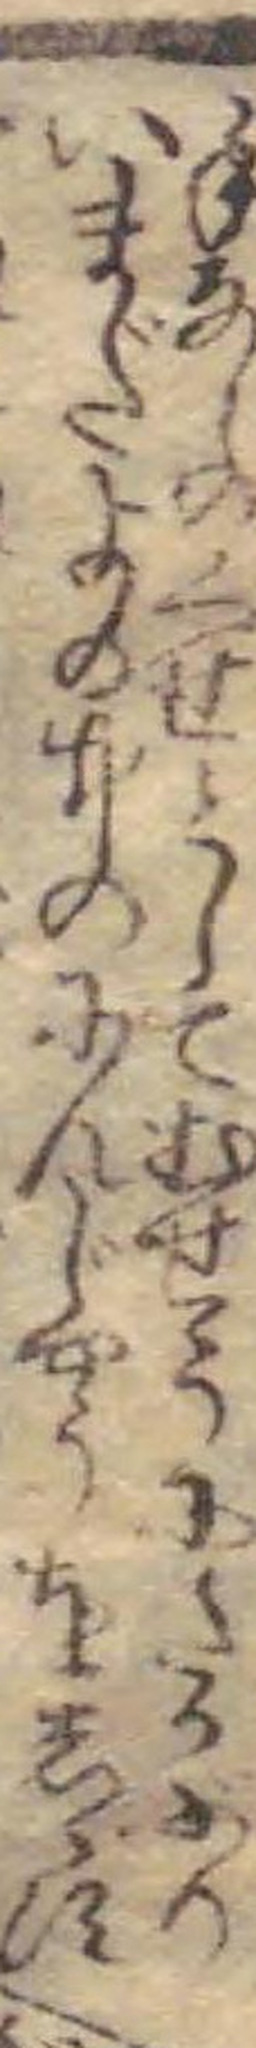いまだよの中のにんじやうをしらす
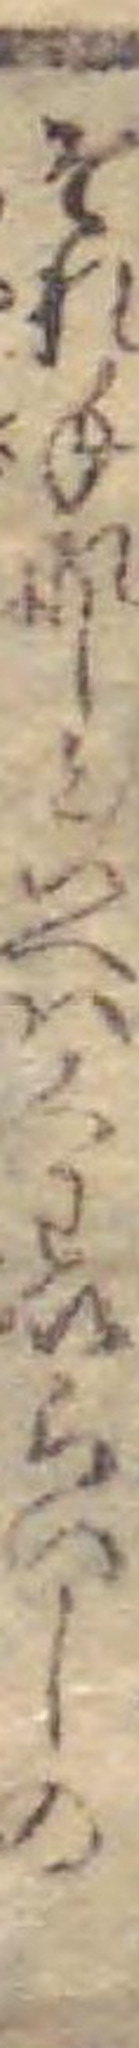それ手なしといへはくわいらいしの
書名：人間一心覗替繰 : 2巻
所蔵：国立国会図書館 National Diet Library, JAPAN
